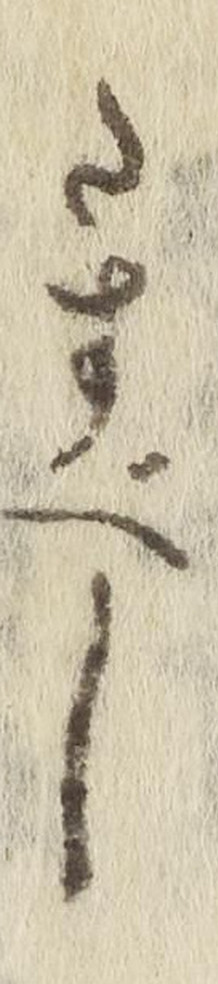たすべし
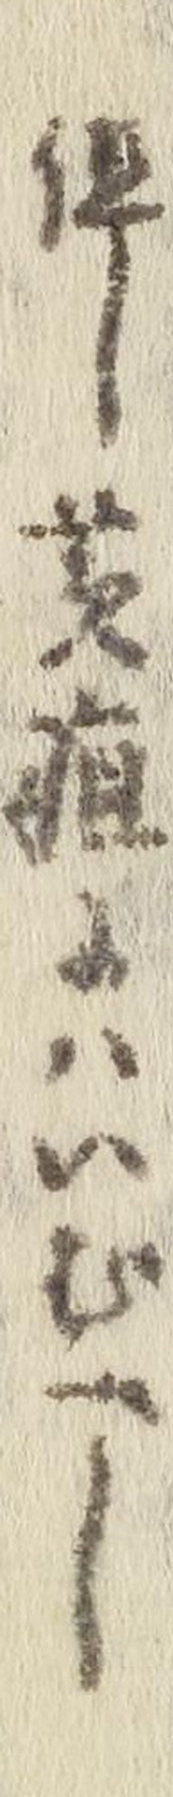但し黄疽にはいむへし
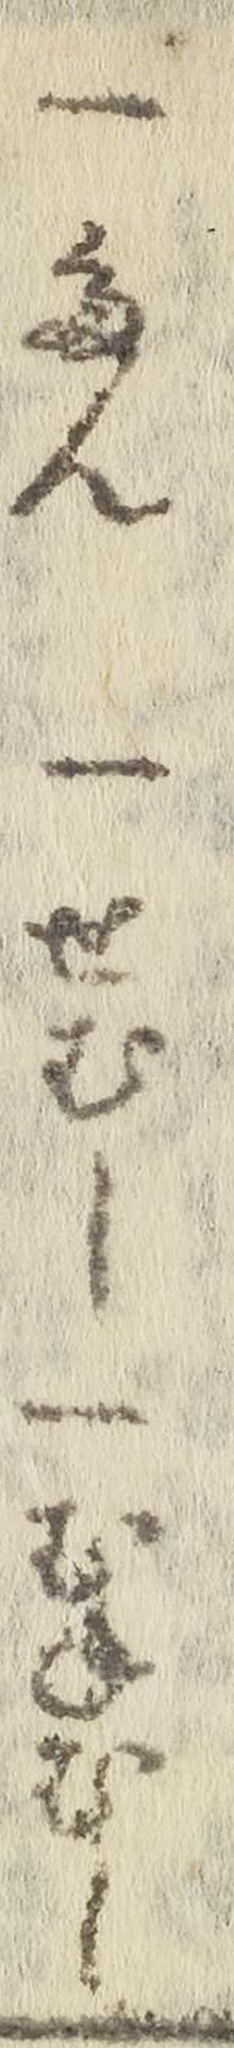一たん一せむし一むねむし
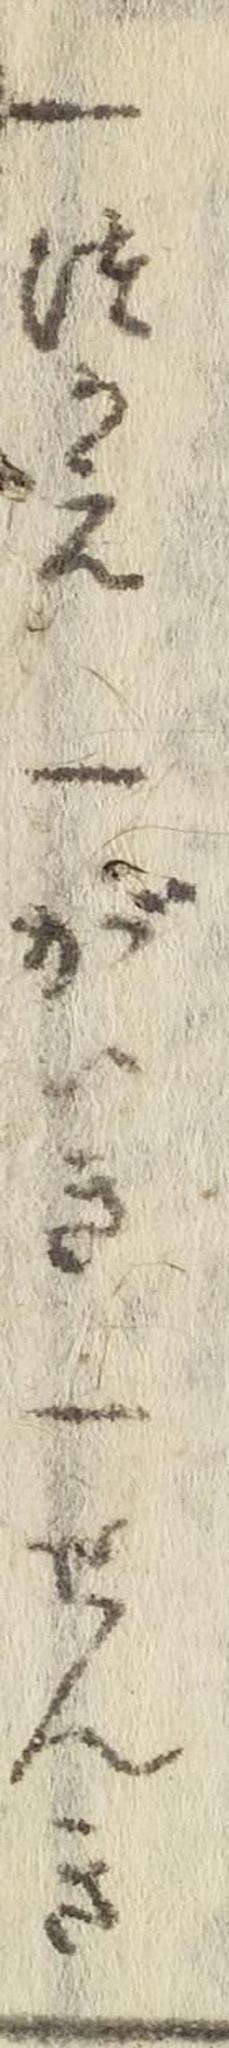一つかえ一がいき一せんき
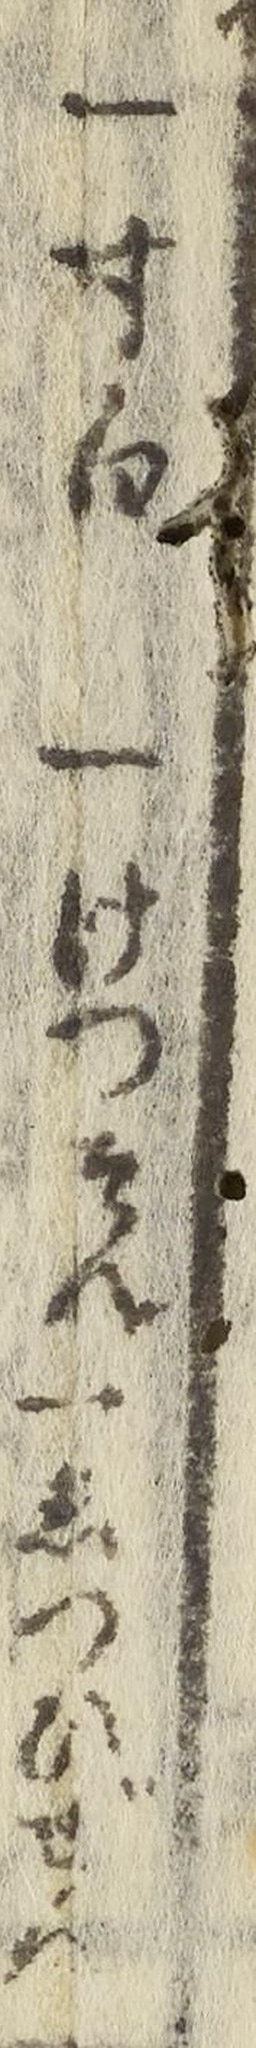一寸白一けつそん一しつひぜん
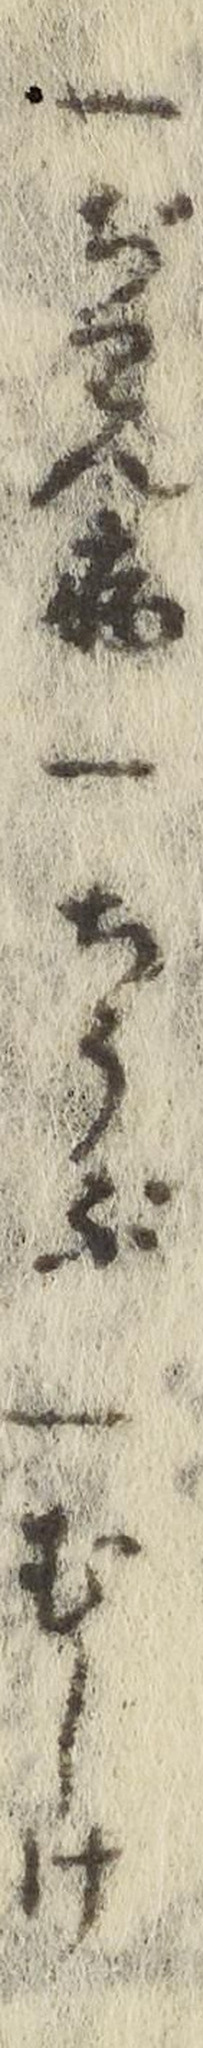一ぢりん病一ちうぶ一むしけ
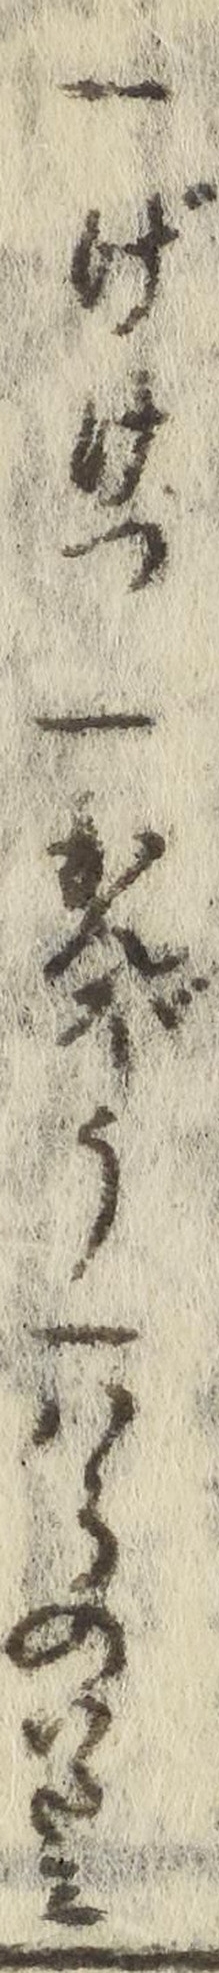一げけつ一かんぼう一はらのいたみ
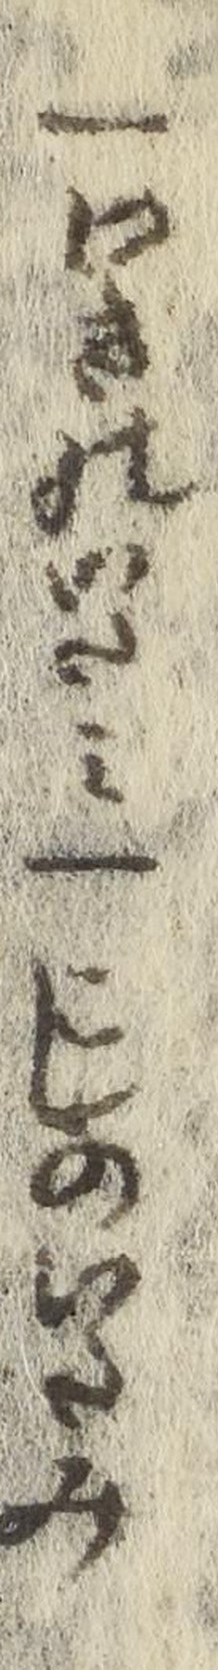一わきのいたみ一こしのいたみ
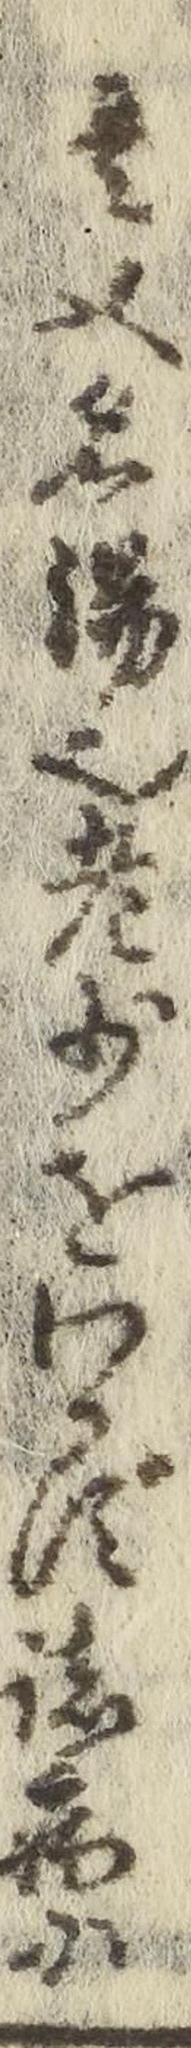是又名湯也老少をわかず諸病に
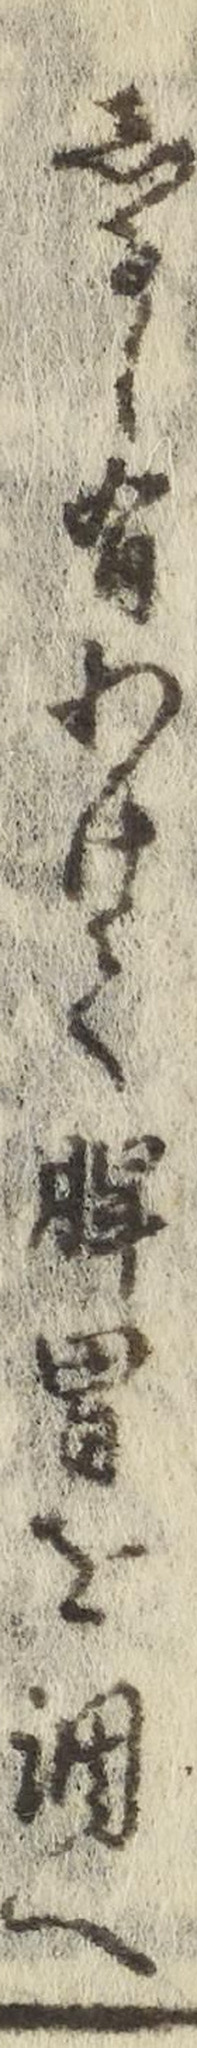しるし有わけて脾胃を調へ
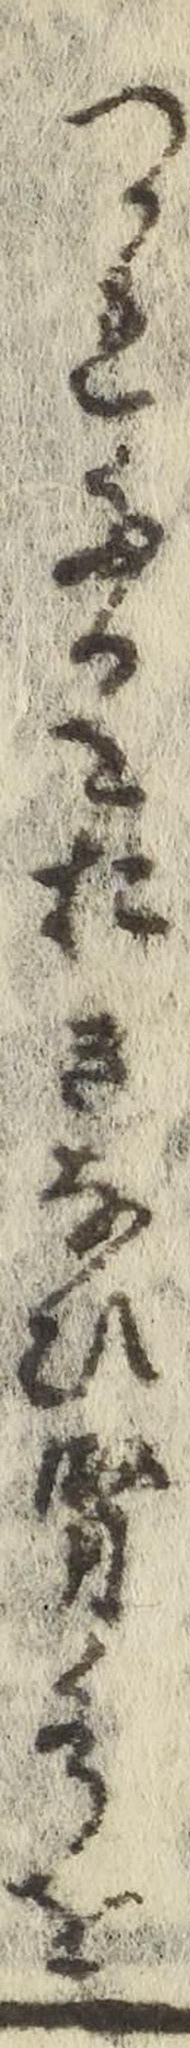つかれたるをおきなひ腎水を
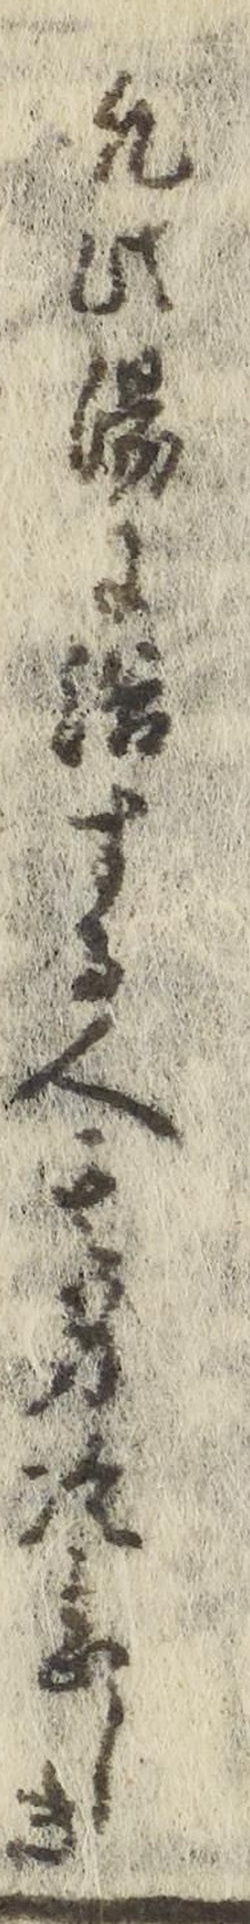凡此湯に浴する人其身冷甚しき
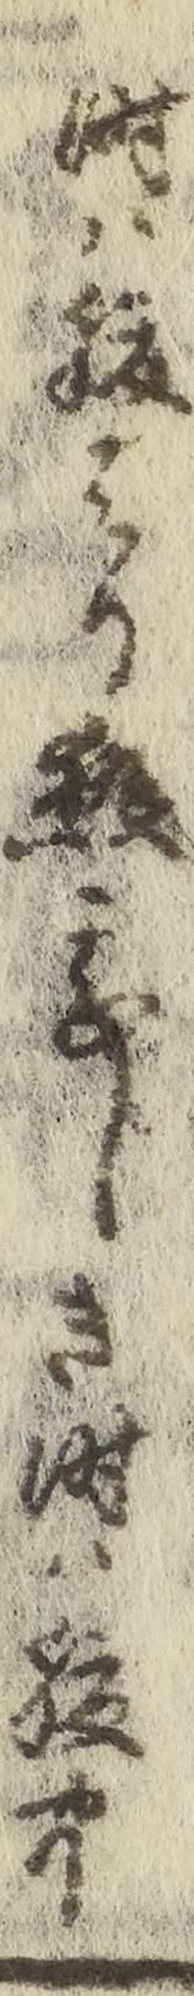時は腹はり熱甚しき時は腹中
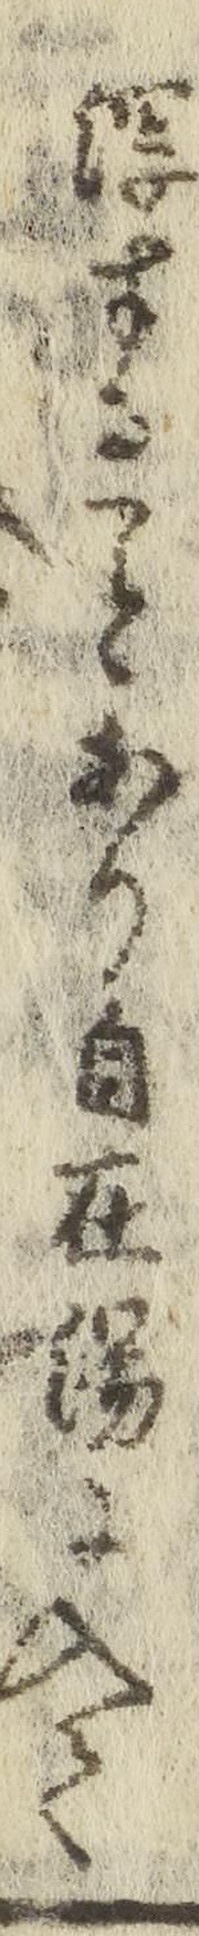瀉することあり自在湯に入りて
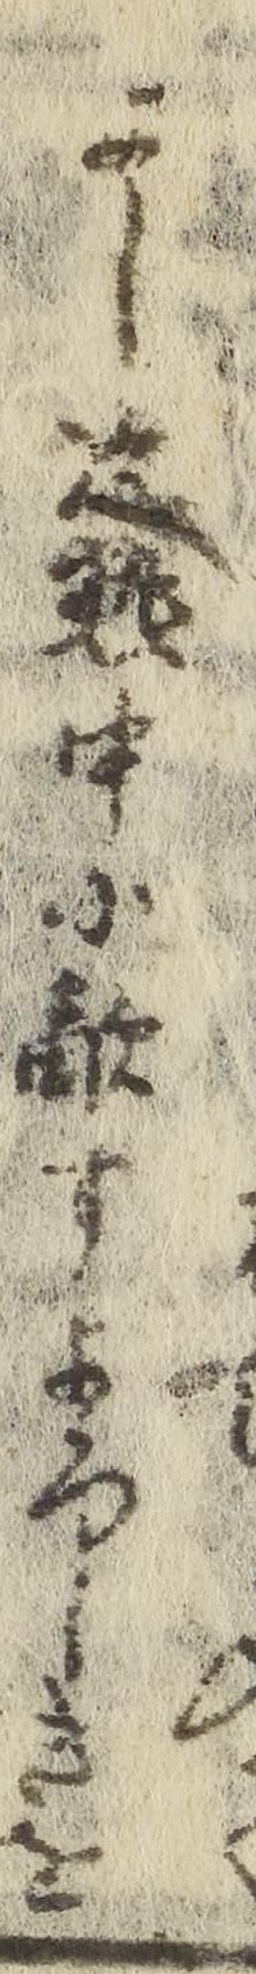よし冷熱中に敵すよろしきを
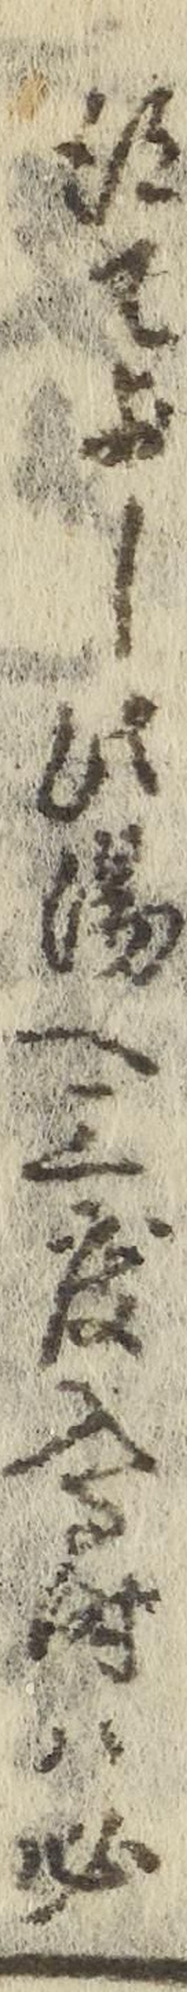得てよし此湯へ三度入る時は必
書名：日光山中禅寺　温泉記　全
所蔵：東京大学地震研究所図書室 Earthquake Research Institute Library, The University of Tokyo, JAPAN
